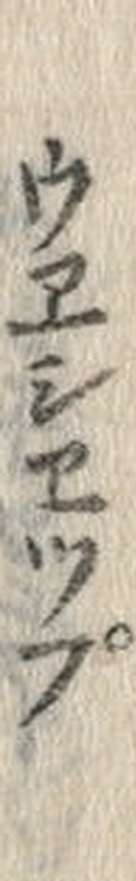ウヱシヱツプ
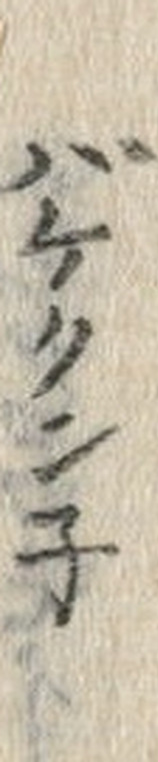バケクンネ
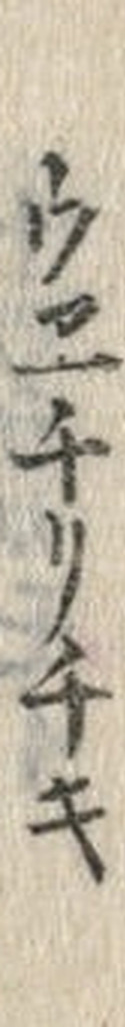ウヱチリチキ
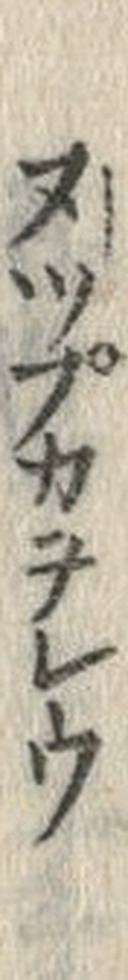ヌツプカヲレウ
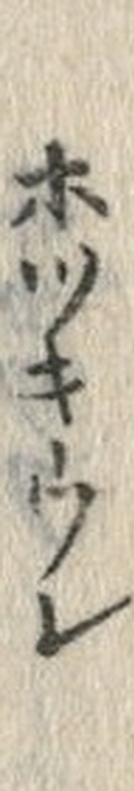ホツキウレ
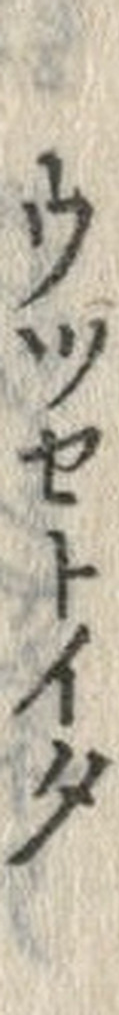ウツセトイタ
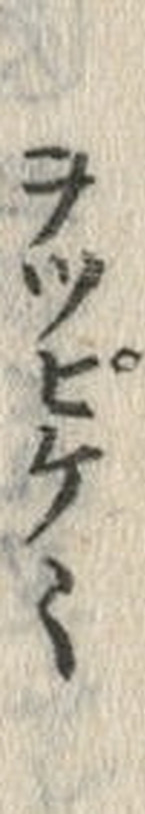ヲツピケヽ
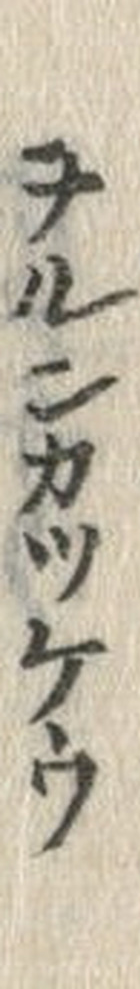ヲルンカツケウ
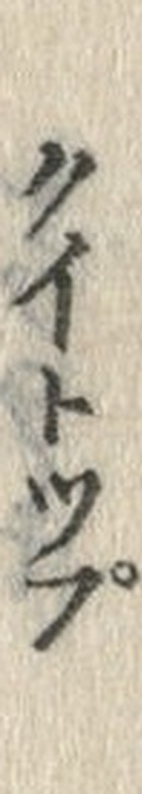クイトツプ
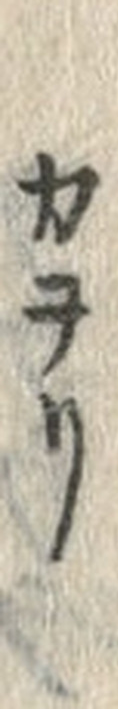カヲリ
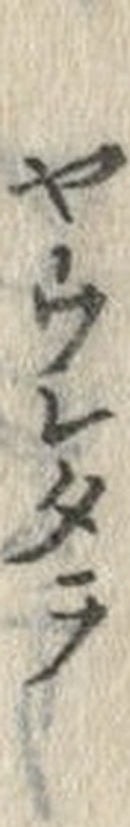ヤウレタラ

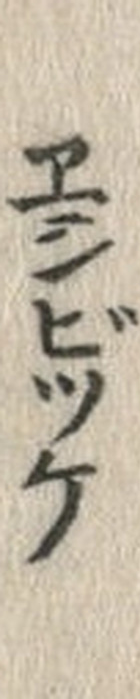ヱシビツケ
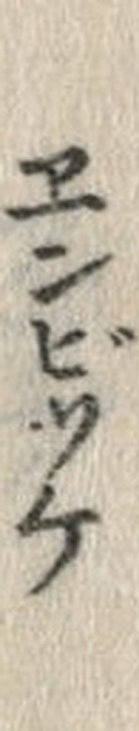ヱンビツケ
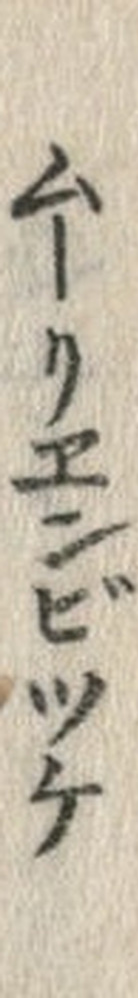ムーリヱンビツケ
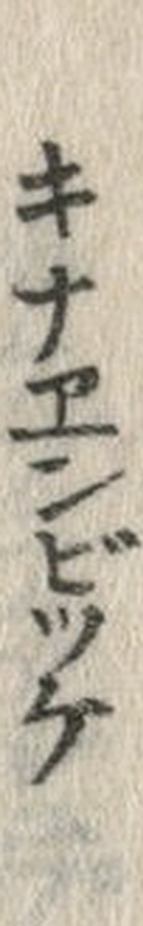キナヱンビツケ

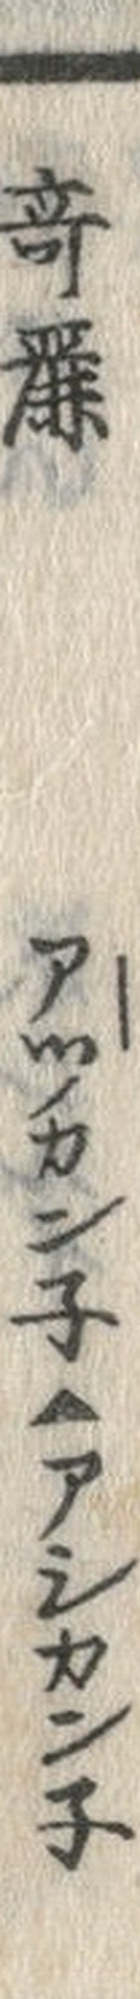奇麗アツカンネ▲アシカンネ
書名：蝦夷方言藻汐草　坤巻
